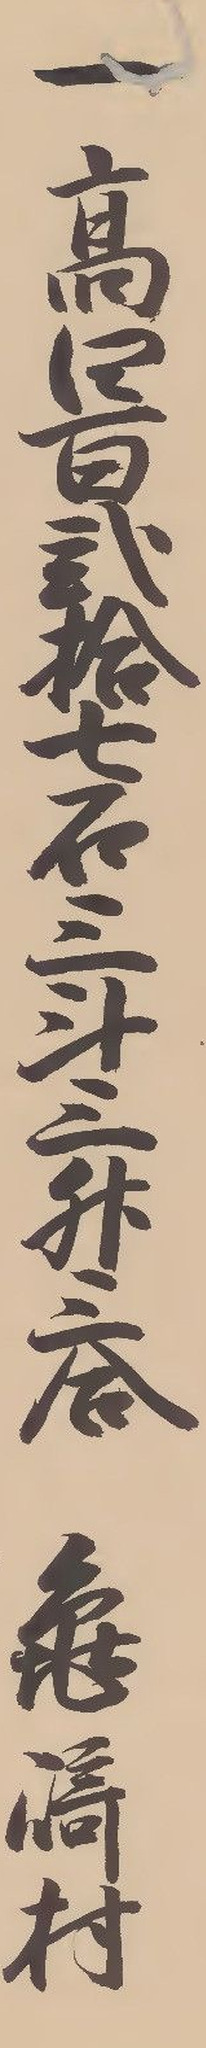一高四百弐拾七石三斗三升三合亀崎村
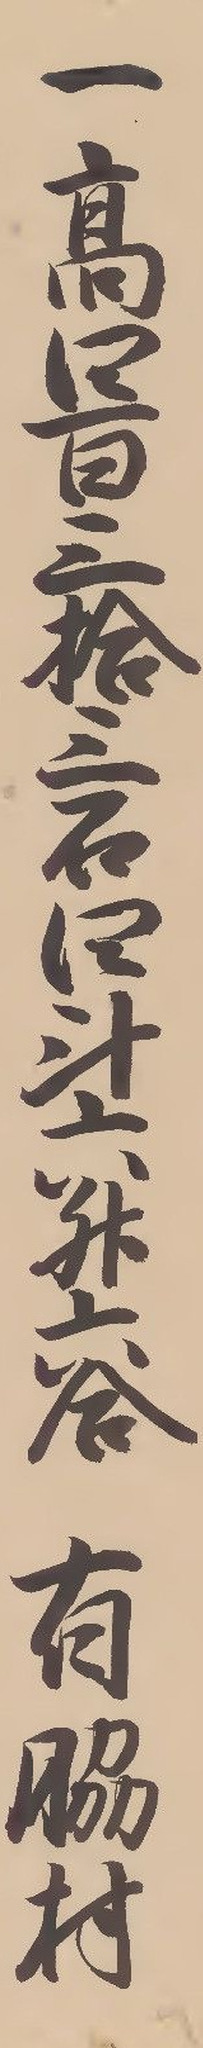一高四百三拾三石四斗六升六合有脇村
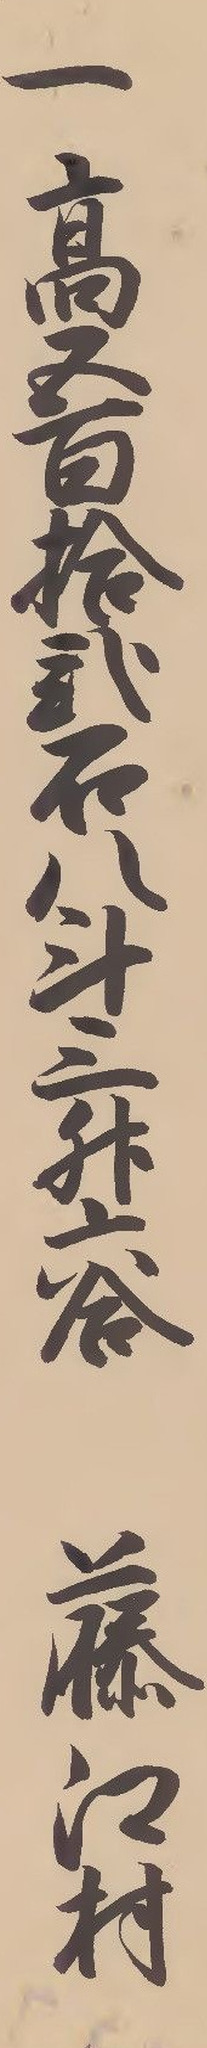一高五百拾弐石八斗三升六合藤江村
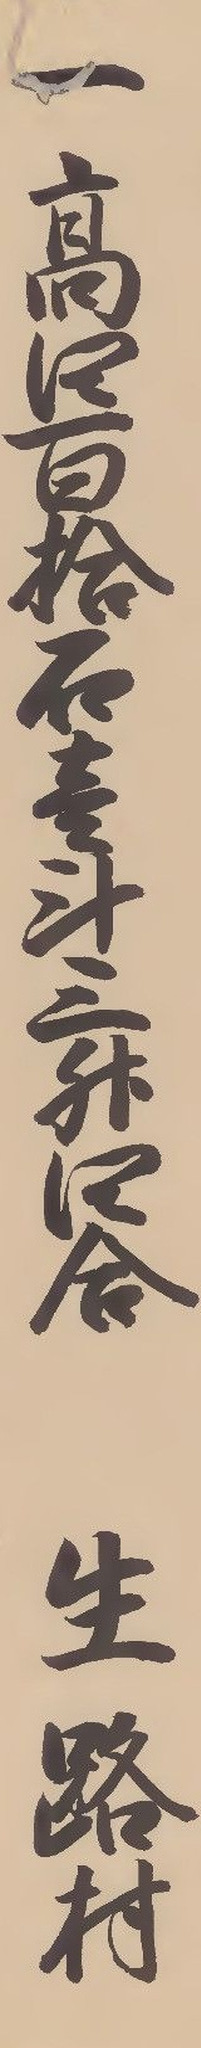一高四百拾石壱斗三升四合生路村
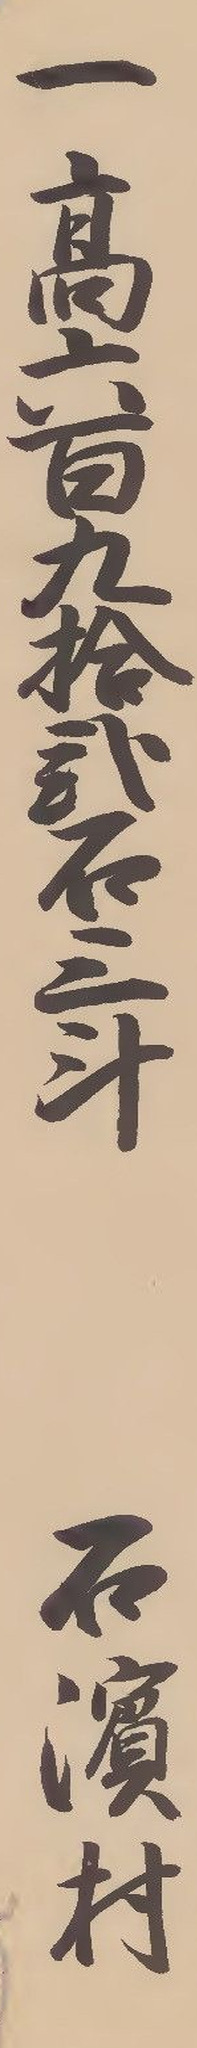一高六百九拾弐石三斗石浜村
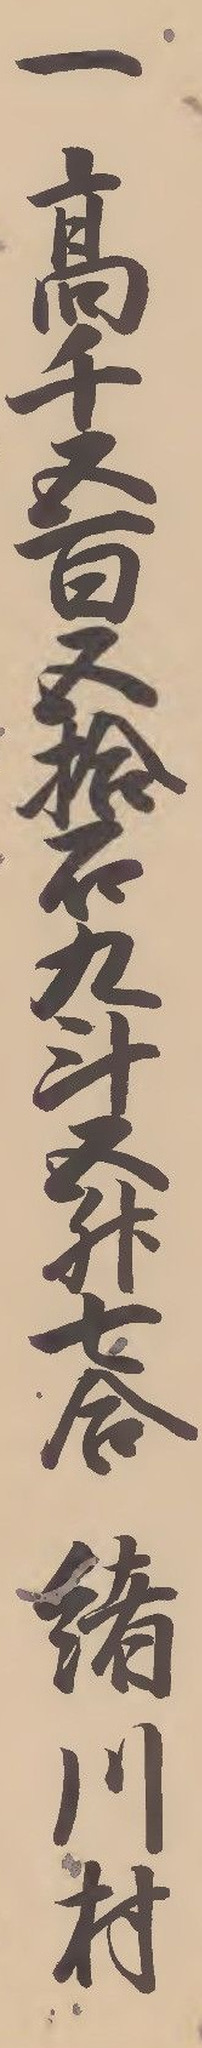一高千五百五拾石九斗五升七合緒川村

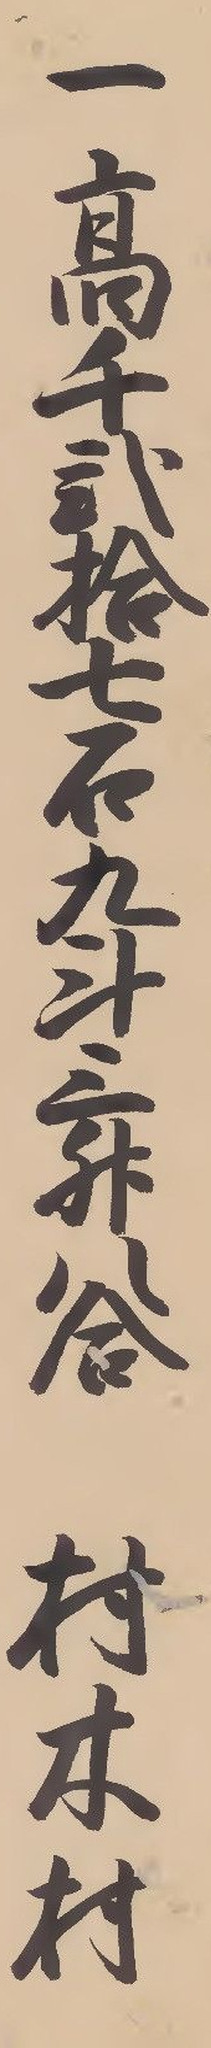一高千弐拾七石九斗三升八合村木村
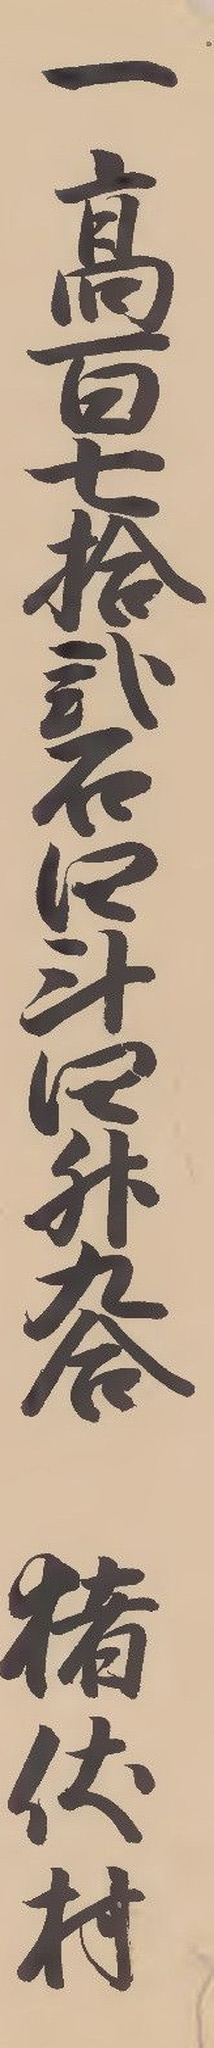一高百七拾弐石四斗四升九合猪伏村
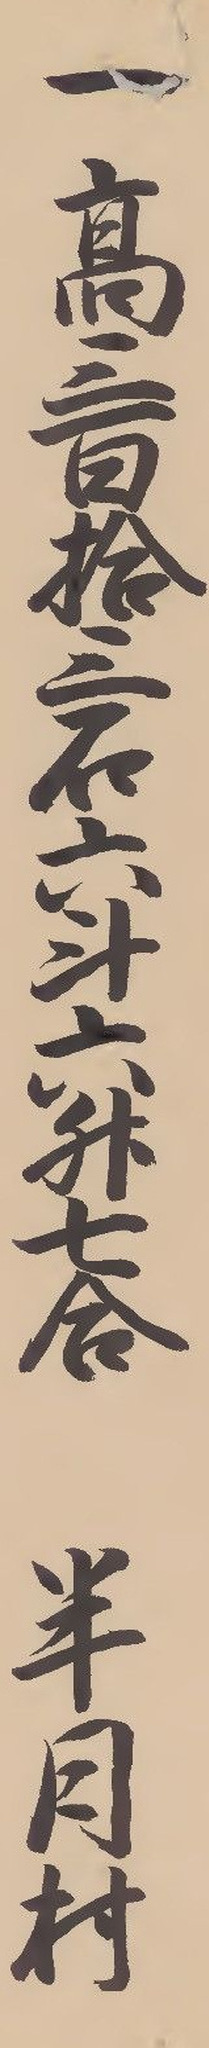一高三百拾三石六斗六升七合半月村
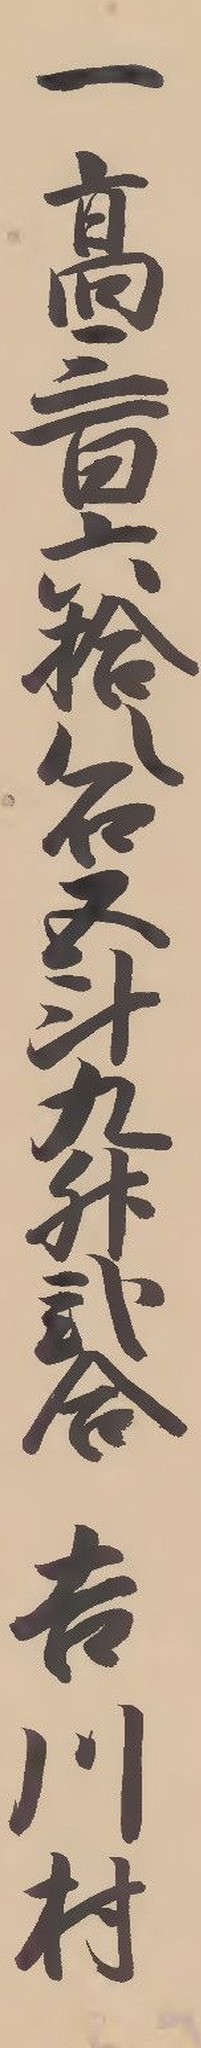一高三百六拾八石五斗九升弐合吉川村
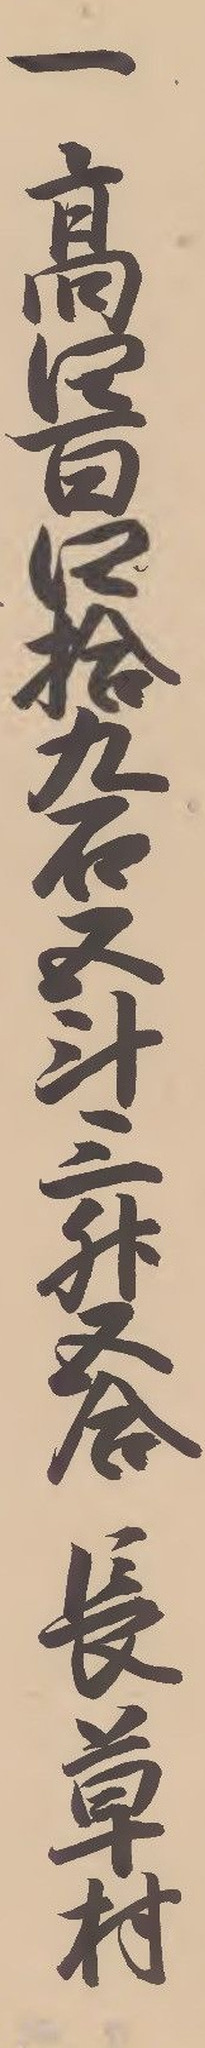一高四百四拾九石五斗三升五合長草村
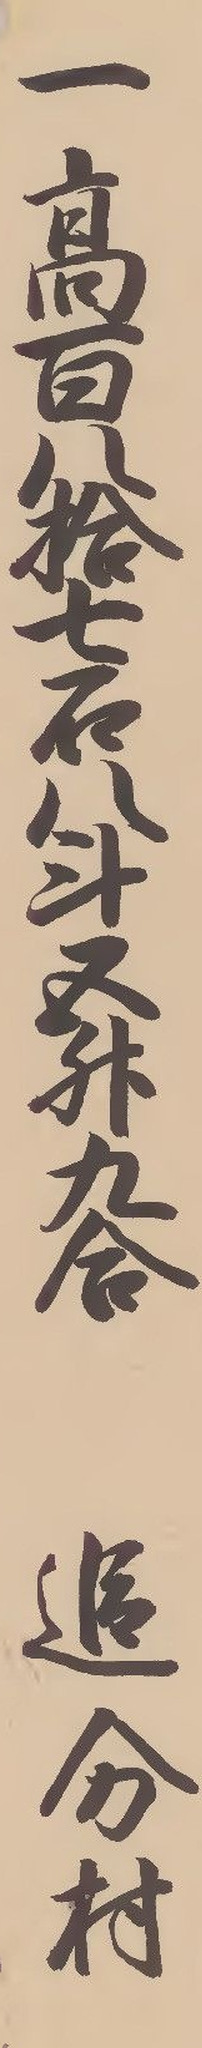一高百八拾七石八斗五升九合追分村
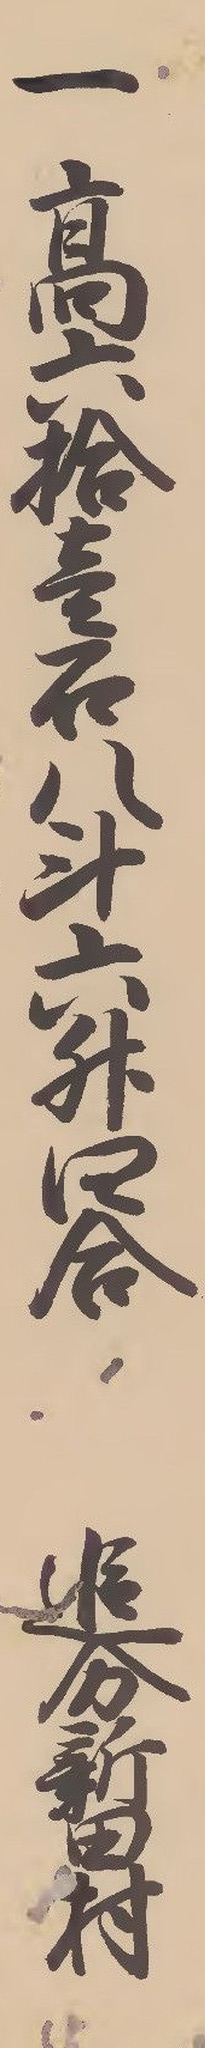一高六拾壱石八斗六升四合追分新田村

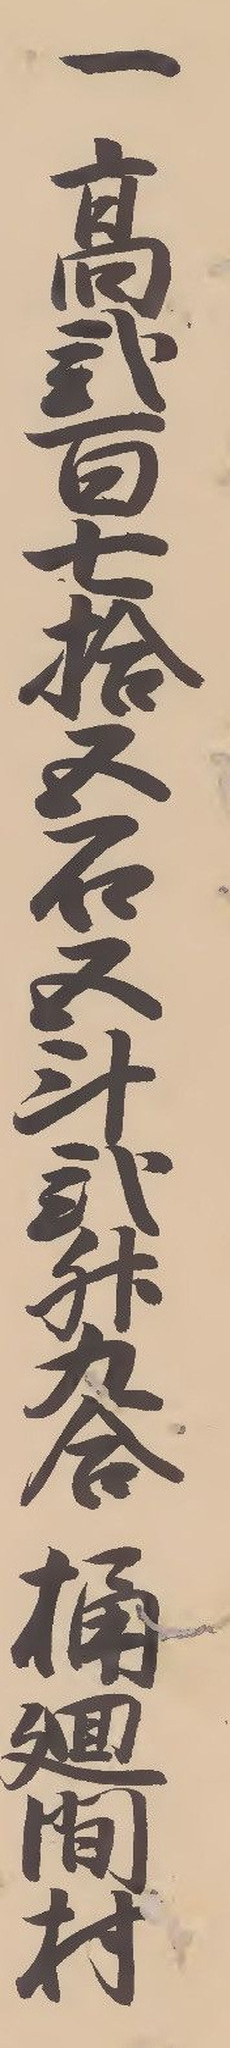一高弐百七拾五石五斗弐升九合桶廻間村
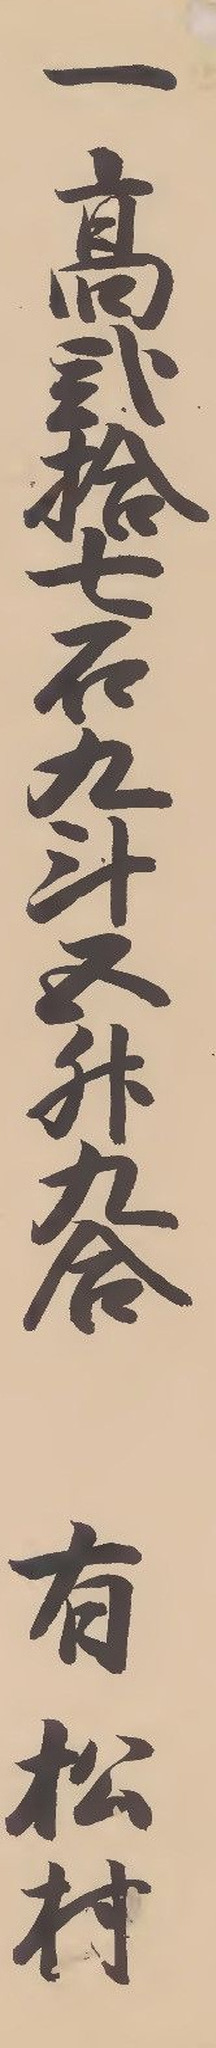一高弐拾七石九斗五升九合有松村
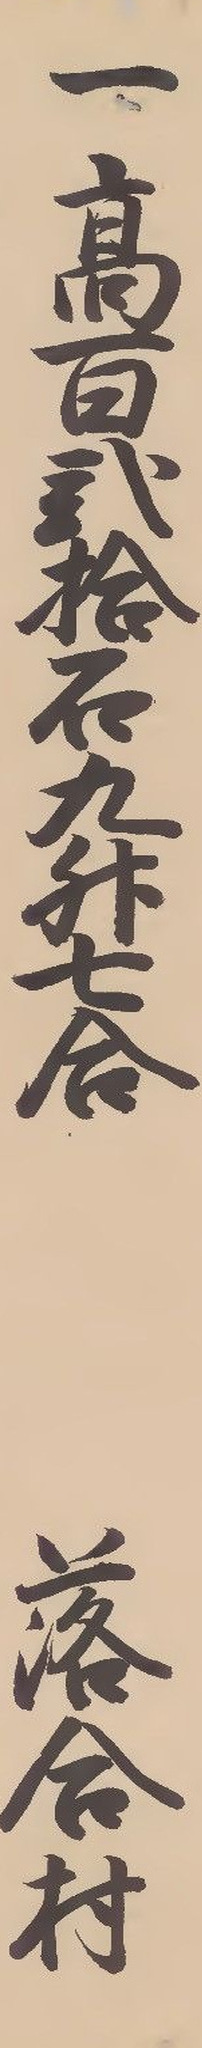一高百弐拾石九升七合落合村
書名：尾張国郷帳
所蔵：国立公文書館 National Archives of Japan
